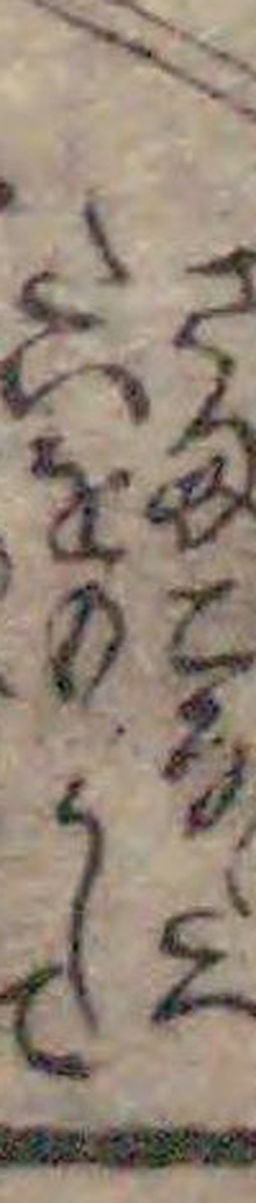たいをもして
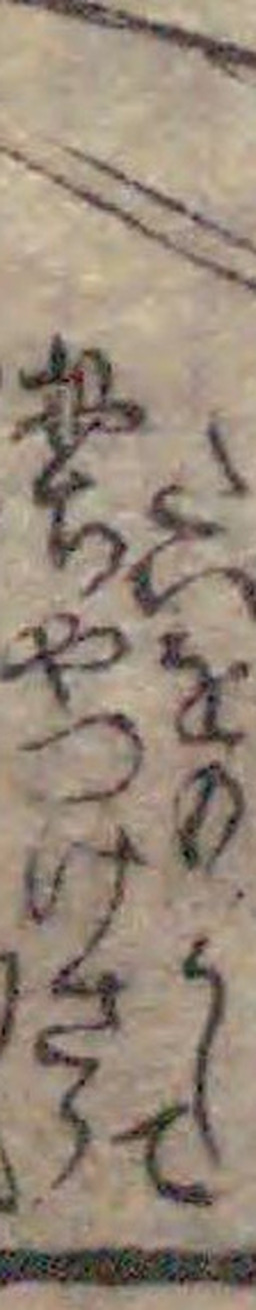おちやつけさら
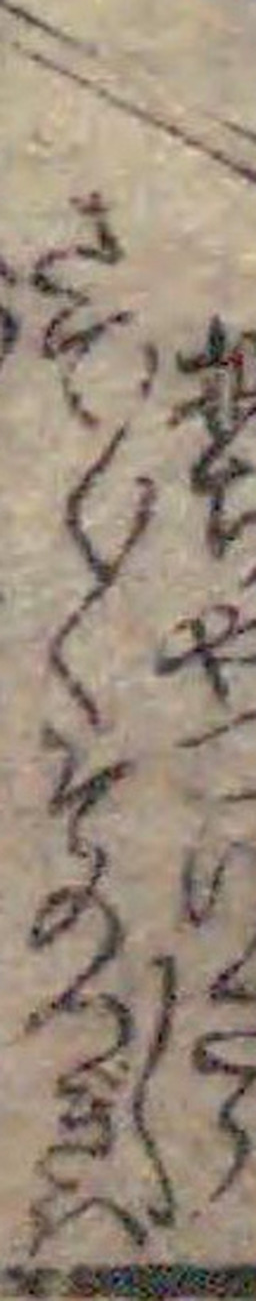さて〳〵〳〵そのつぎは
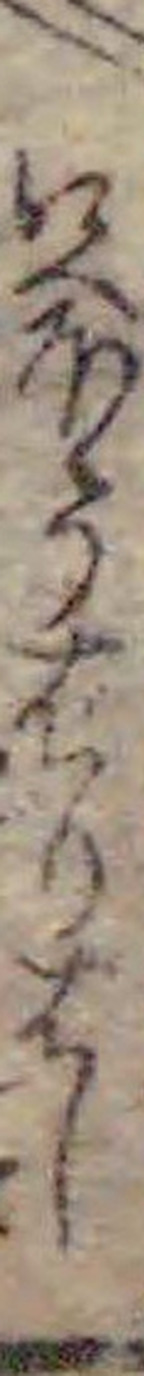口へほうばりはし
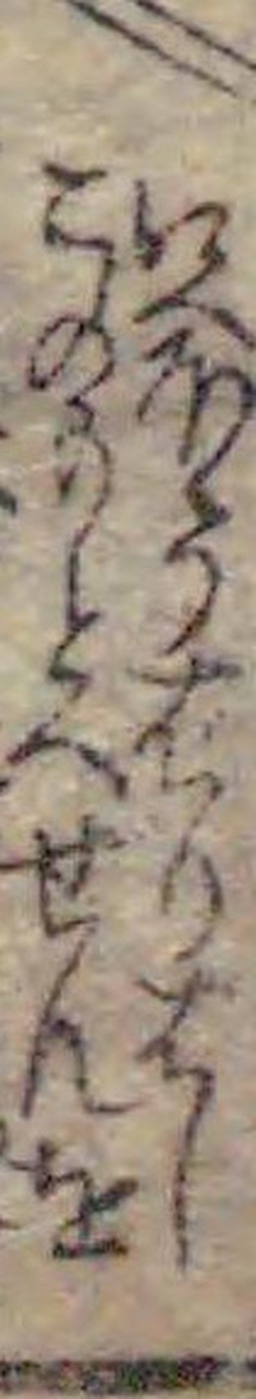ごのもとへぜんを
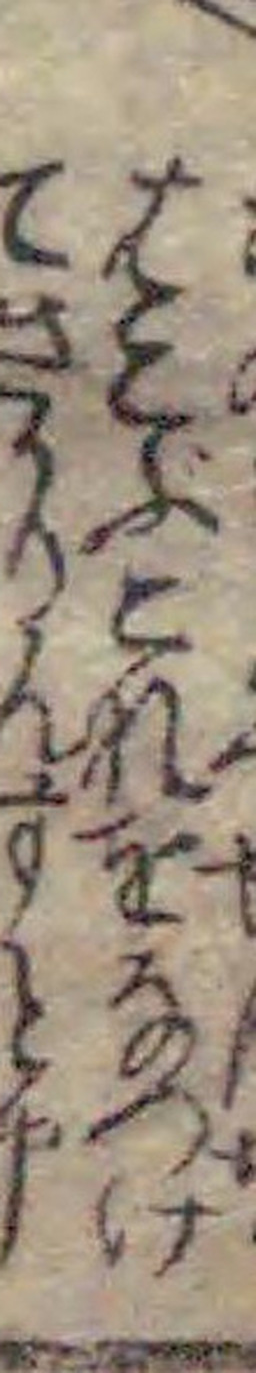てさかりんすと申
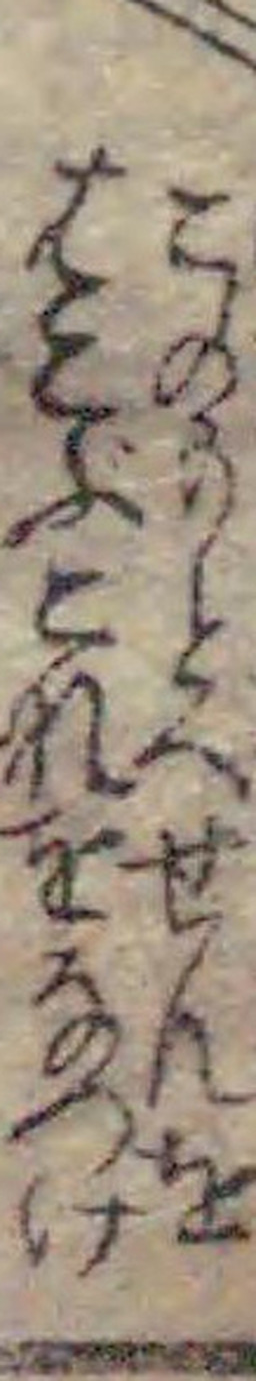はこぶこれをなつけ
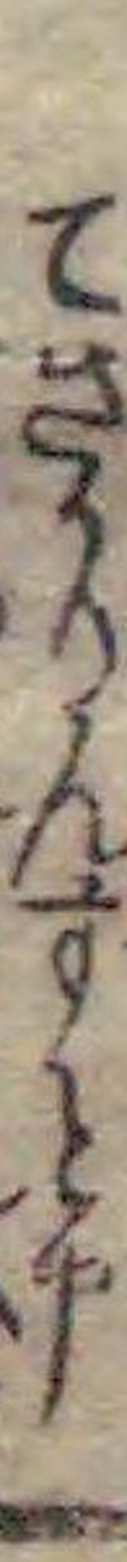てさかりんすと申
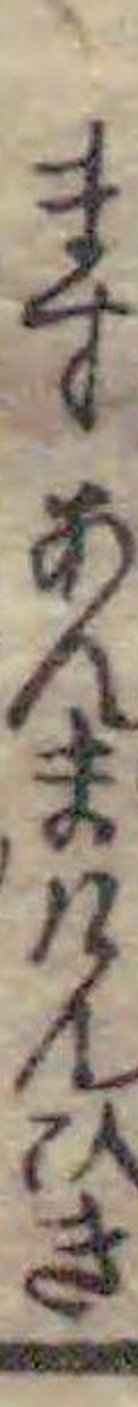ますあんまけんひき
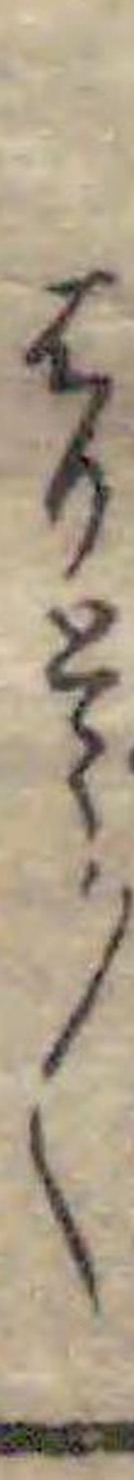はりとう〳〵
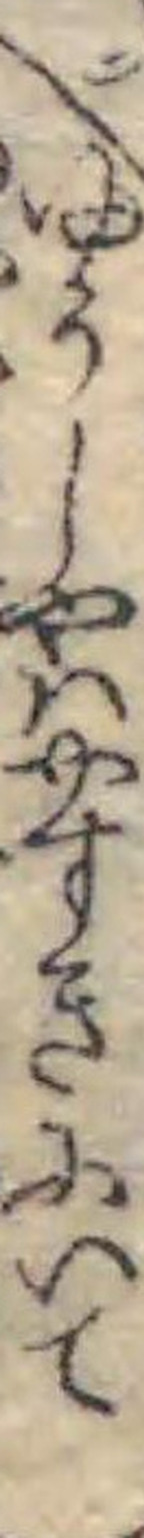ゆうしやはやすきにいて
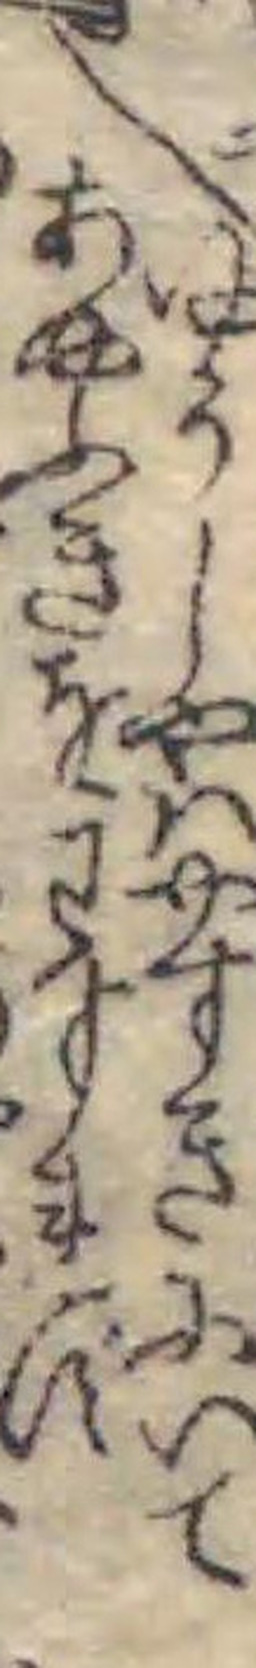あやふきをわすれず
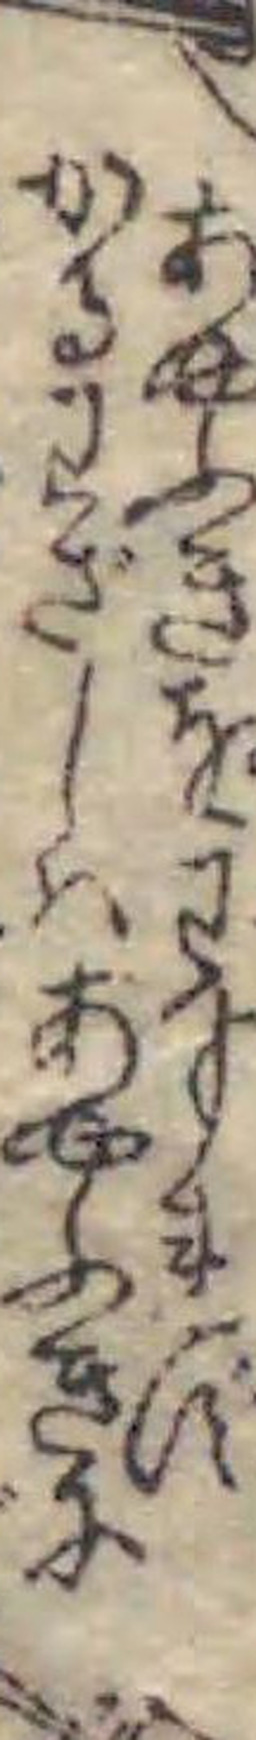かるわざしはあやふきに
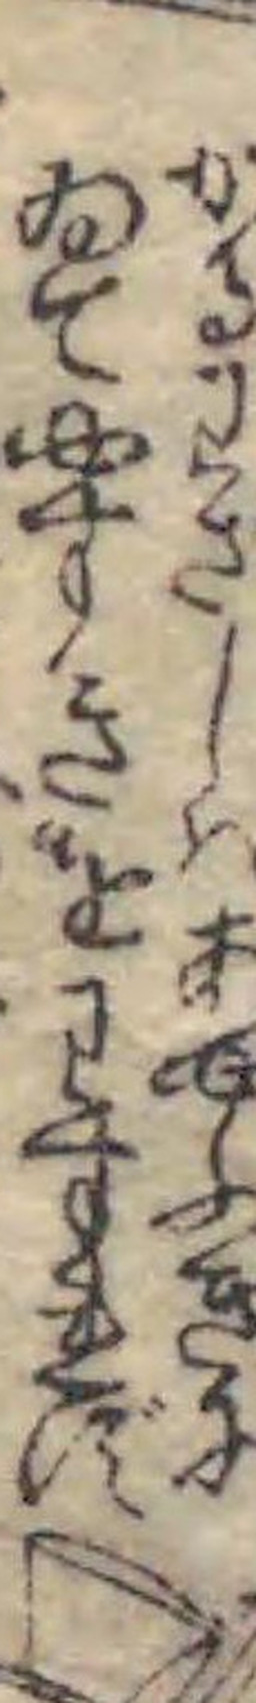ゐてやすきをわすれず
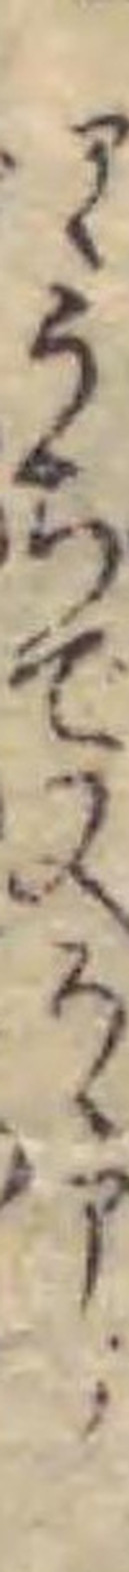アヽうちで又かゝァの
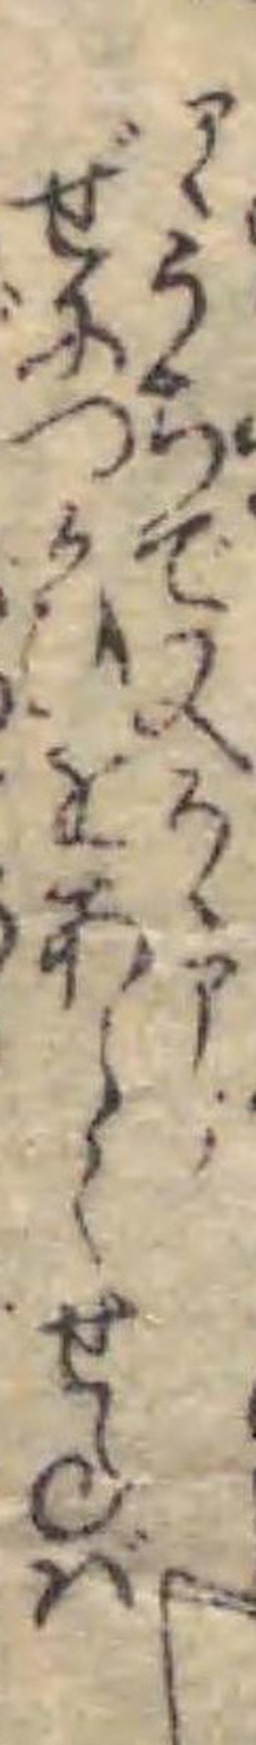ぜにつかひをあらくせねば
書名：人心鏡写絵 : 3巻
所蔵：国立国会図書館 National Diet Library, JAPAN
